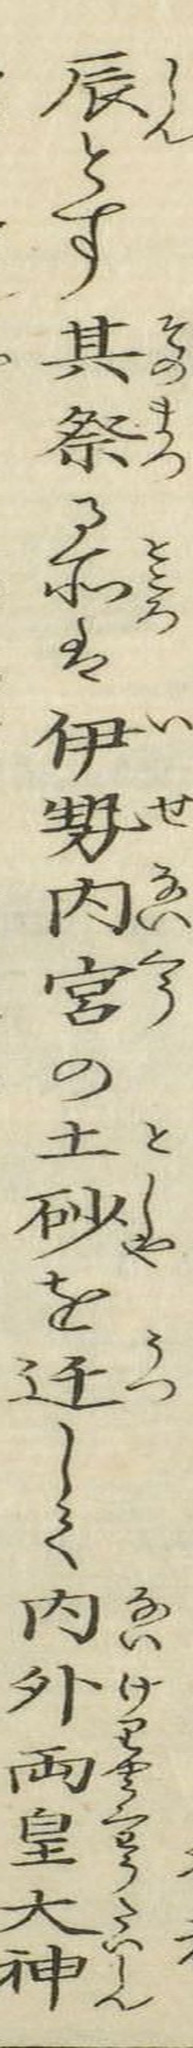辰とす其祭る所は伊勢内宮の土砂を遷して内外両皇大神
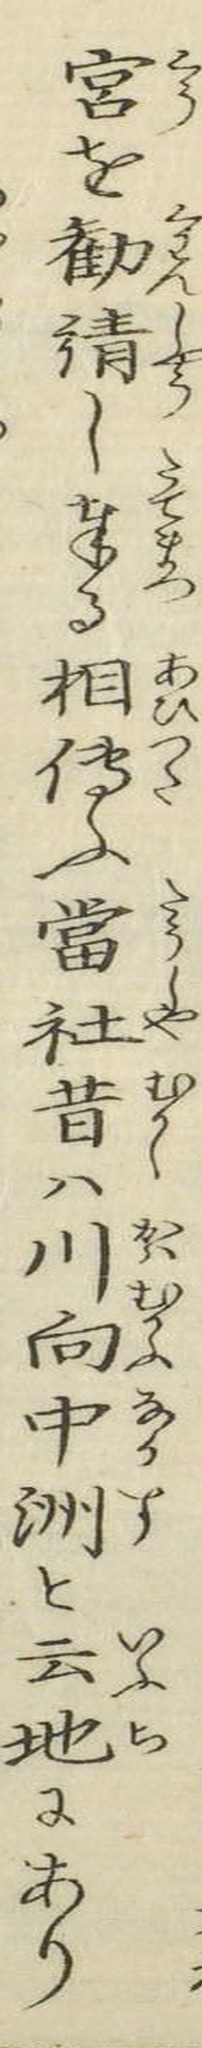宮を勧請し奉相伝ふ当社昔は川向中洲と云地にあり
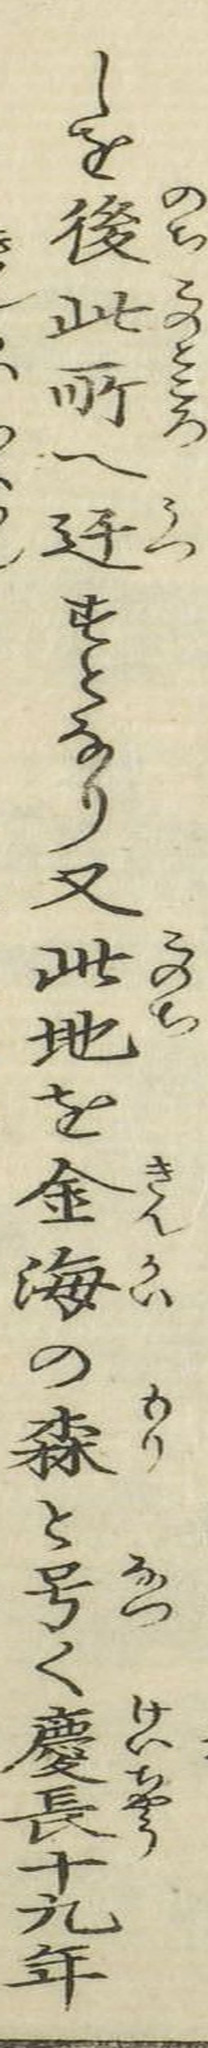しを後此所へ遷すとなり又此地を金海の森と号く慶長十九年
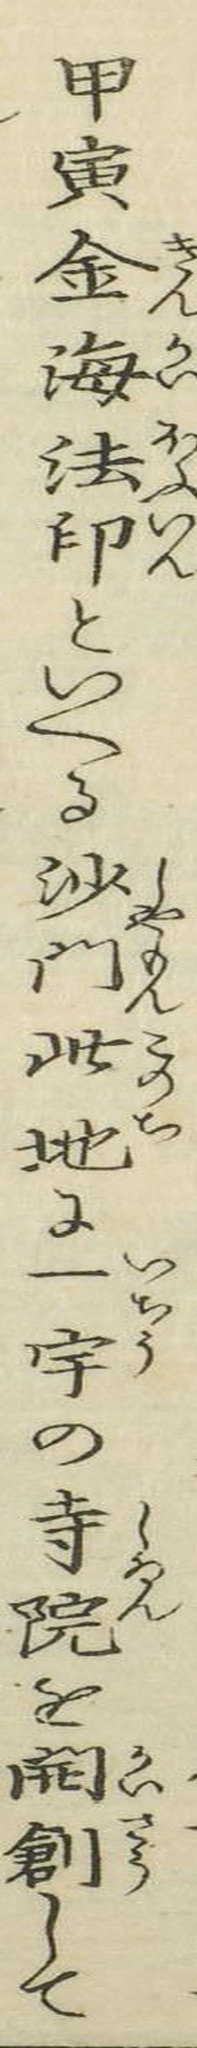甲寅金海法印といへる沙門此地に一宇の寺院を開創して
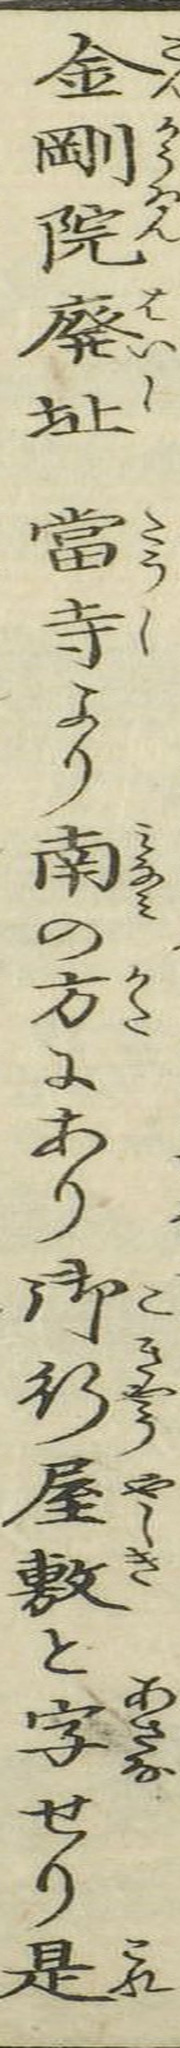金剛院廃止当寺より南の方にあり御行屋敷と字せり是
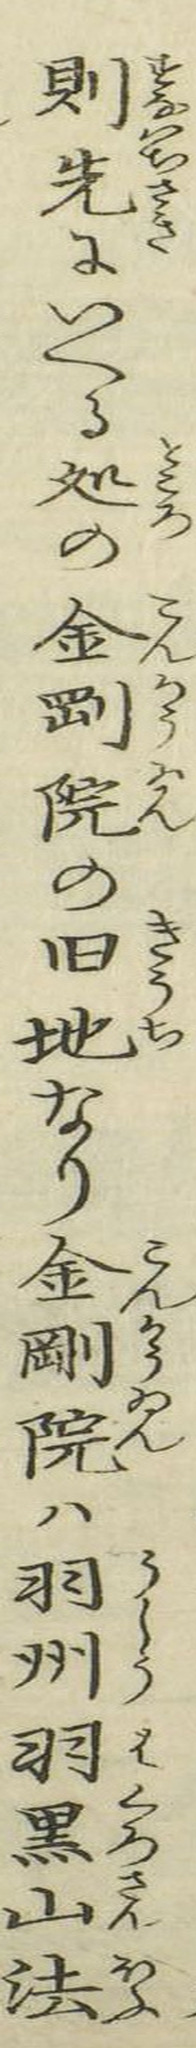則先にいへる処の金剛院の旧地なり金剛院は羽州羽黒山法
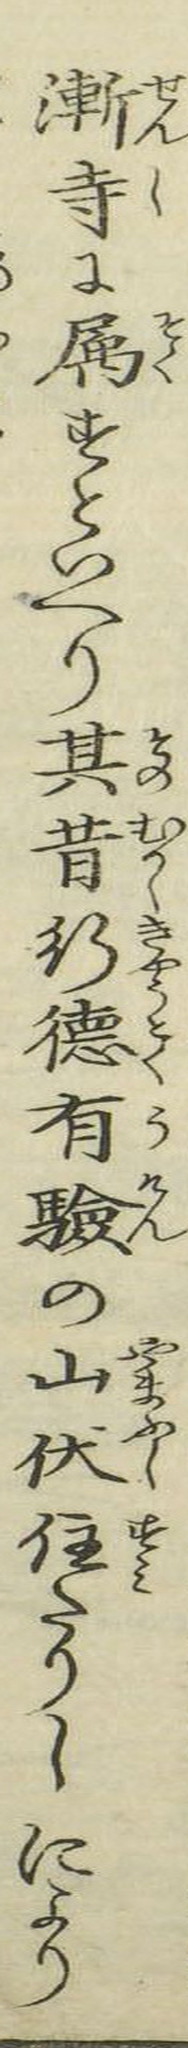漸寺に属すといへり其昔行徳有験の山伏住たりしにより
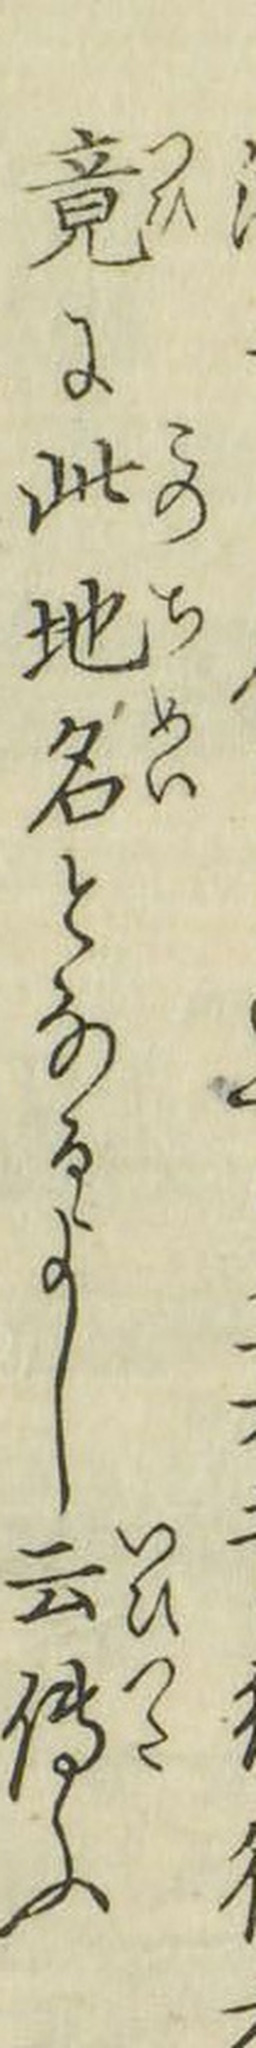竟に此地名となるよし云伝ふ
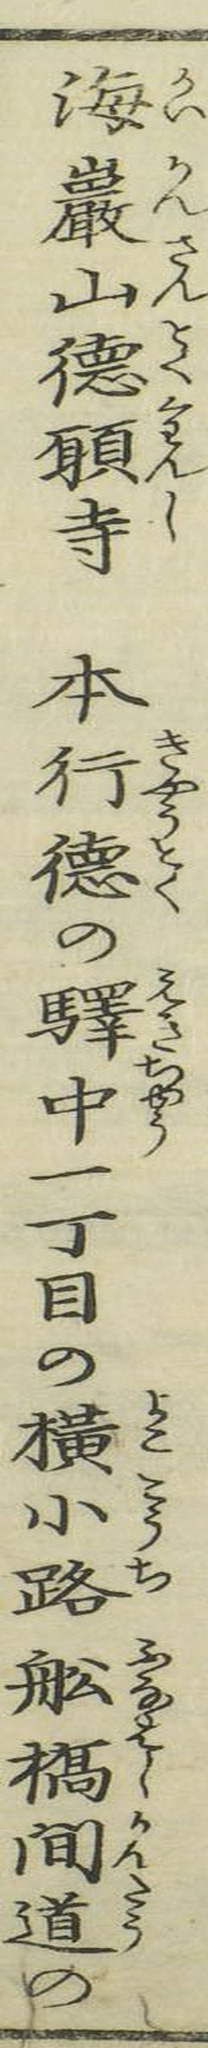海巌山徳願寺本行徳の駅中一丁目の横小路船橋間道の

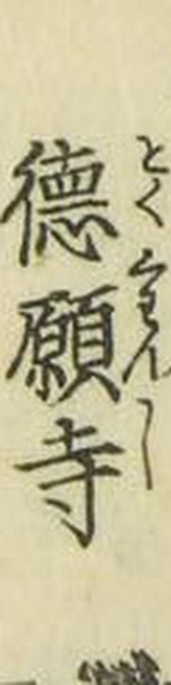徳願寺
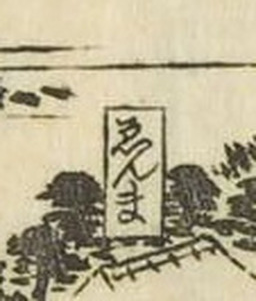ゑんま
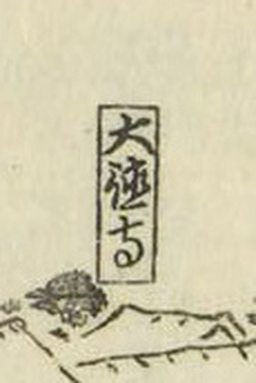大徳寺

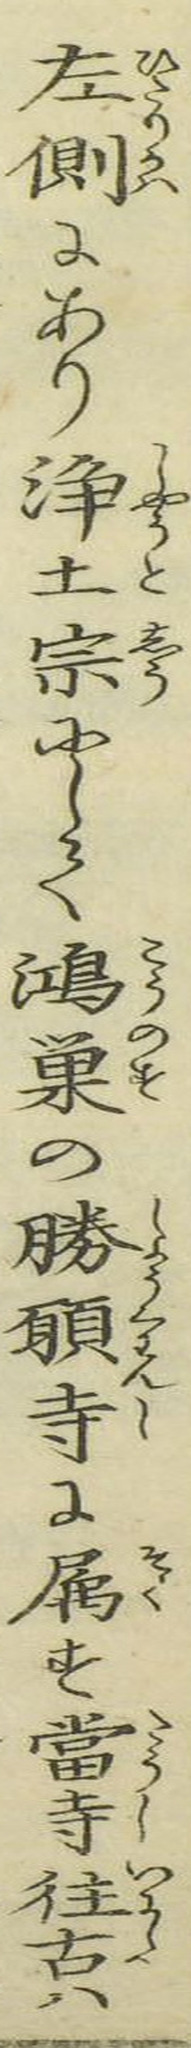左側にあり浄土宗にして鴻巣の勝願寺に属す当寺往古は
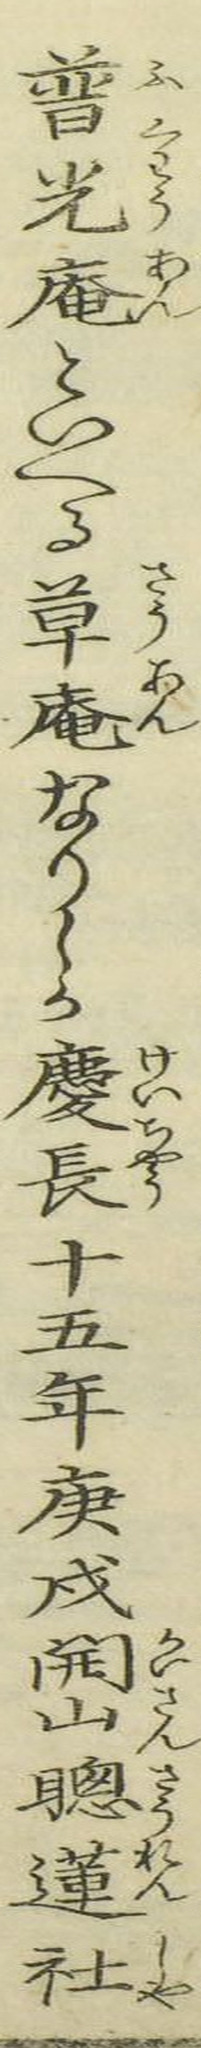普光庵といへる草庵なりしか慶長十五年庚戌開山聰蓮社
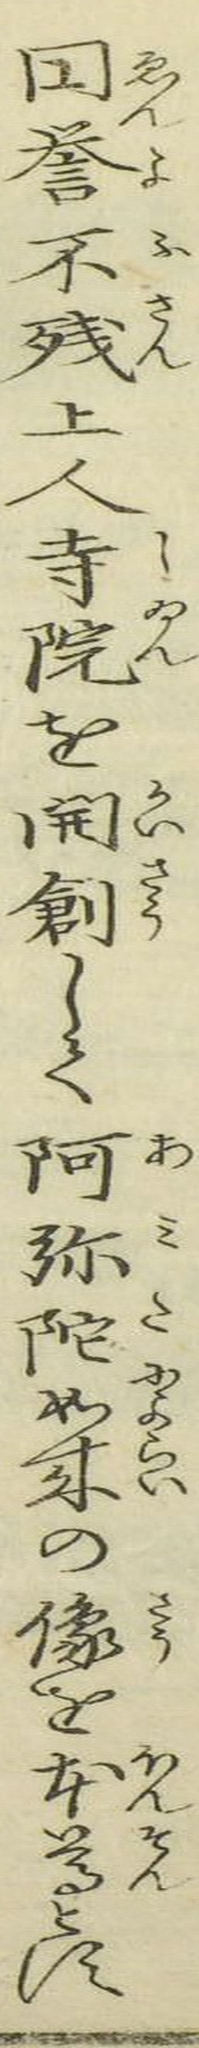円誉不残上人寺院を開創して阿弥陀如来の像を本尊とす
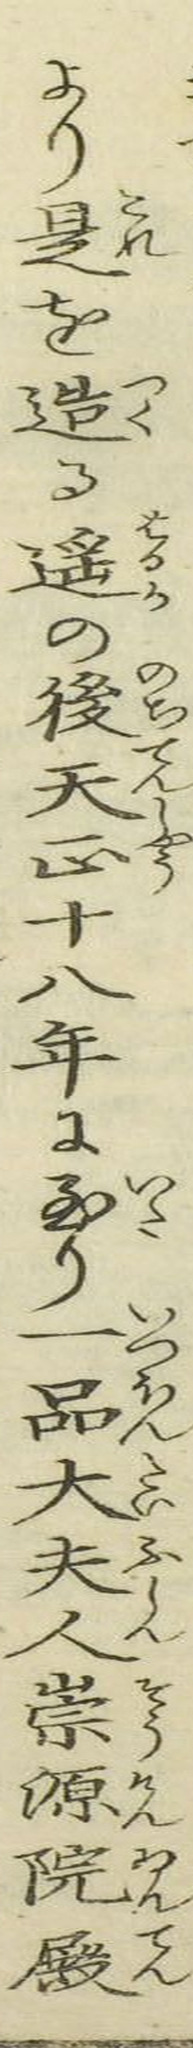より是を造る遥の後天正十八年に至り一品大夫人崇源院殿
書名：江戸名所図会 20巻 巻之20
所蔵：東京学芸大学教育コンテンツアーカイブ
